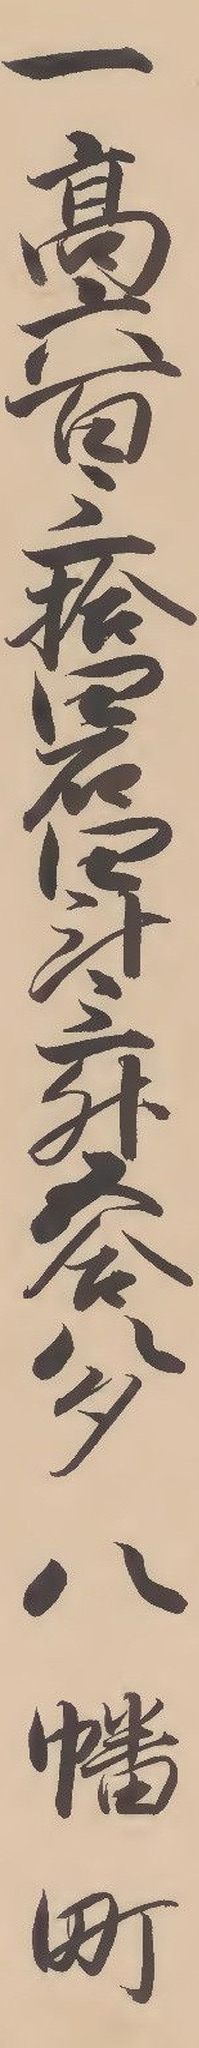一高六百三拾四石四斗三升五合八勺八幡町
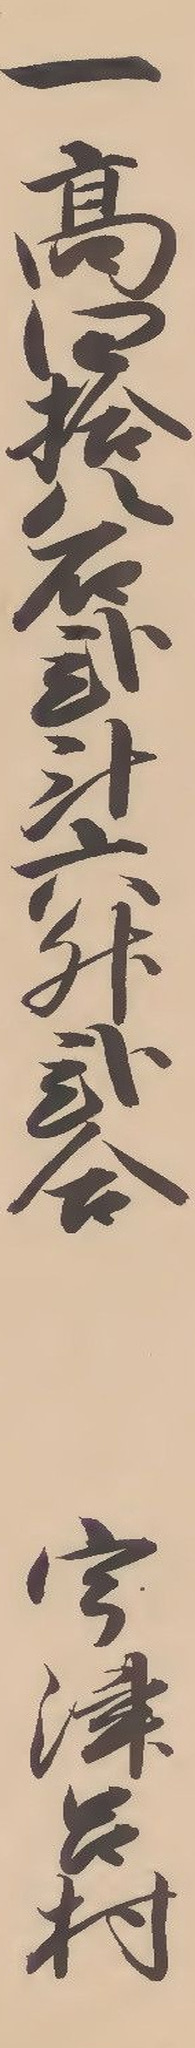一高四拾八石弐斗六升弐合宇津呂村

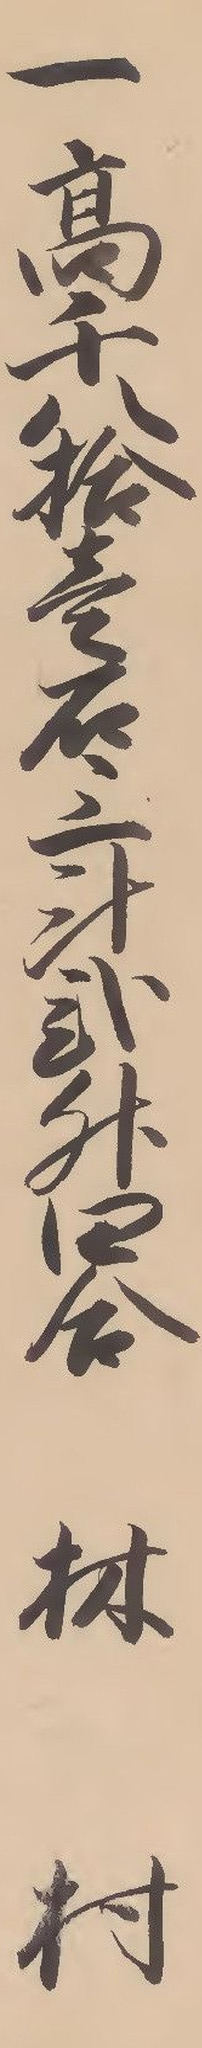一高千八拾壱石三斗弐升四合林村
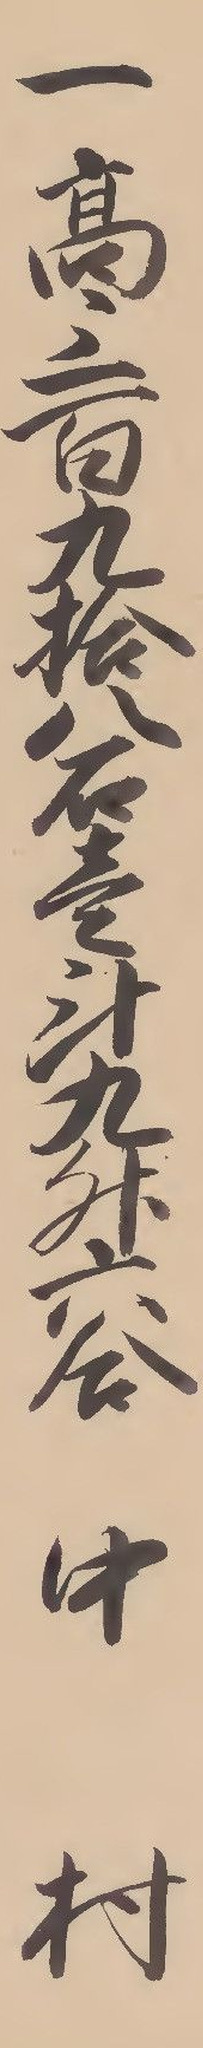一高三百九拾八石壱斗九升六合中村
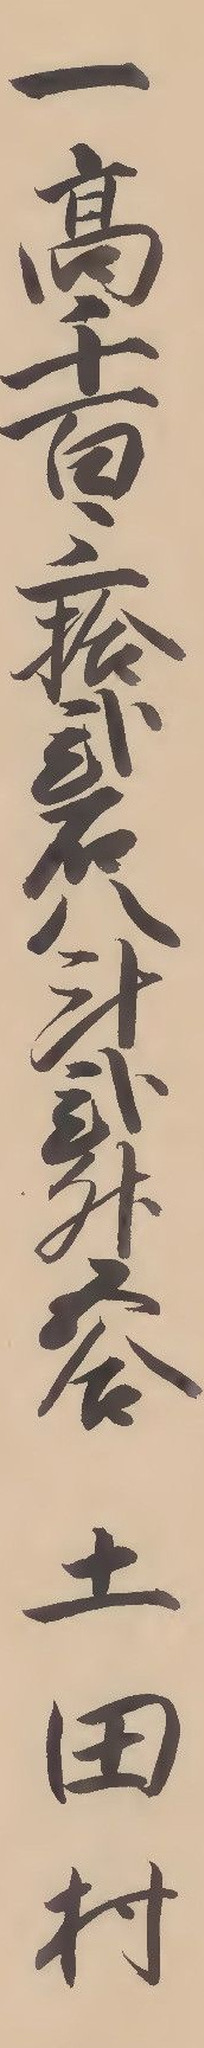一高千百三拾弐石八斗弐升五合土田村
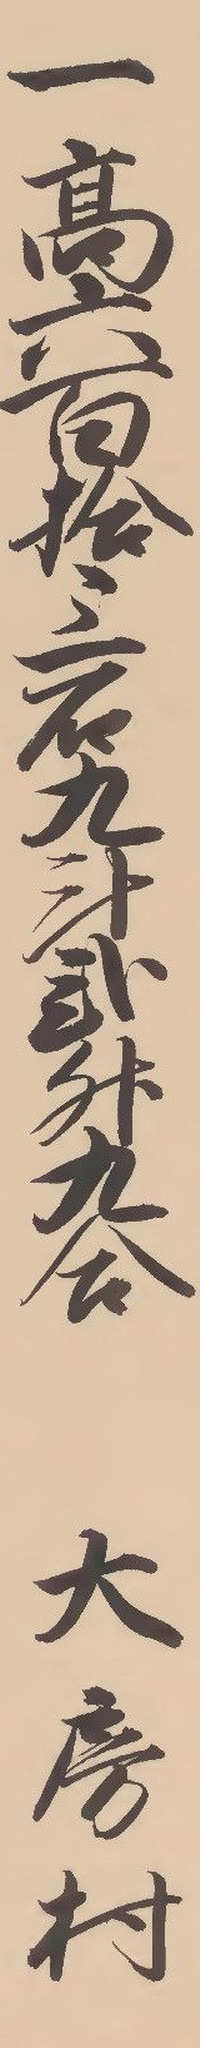一高六百拾三石九斗弐升九合大房村
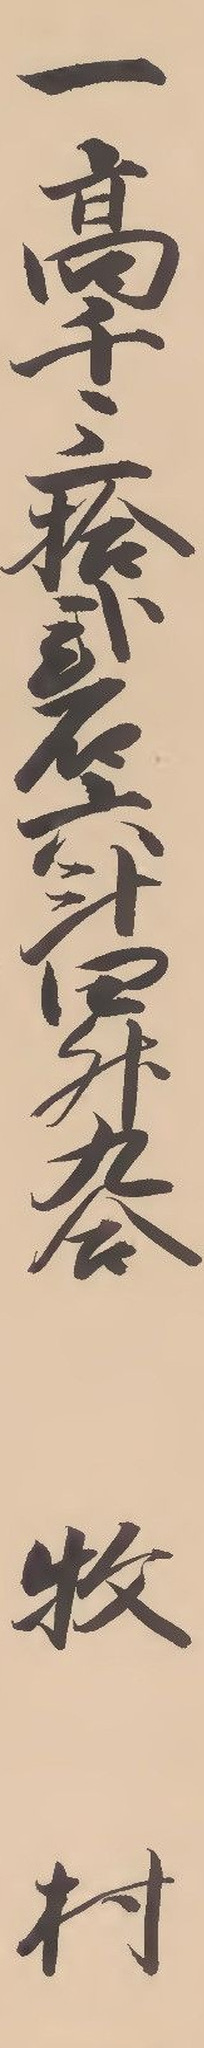一高千三拾弐石六斗四升九合牧村
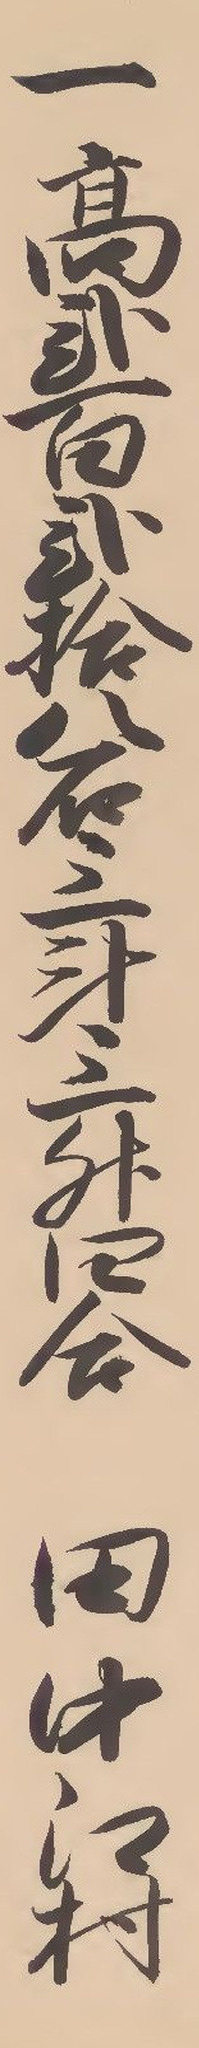一高弐百弐拾八石三斗三升四合田中江村

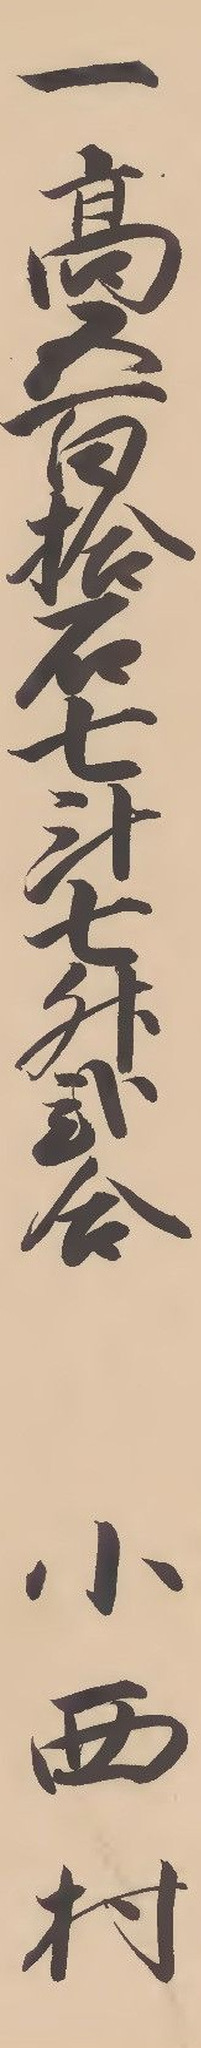一高五百拾石七斗七升弐合小西村
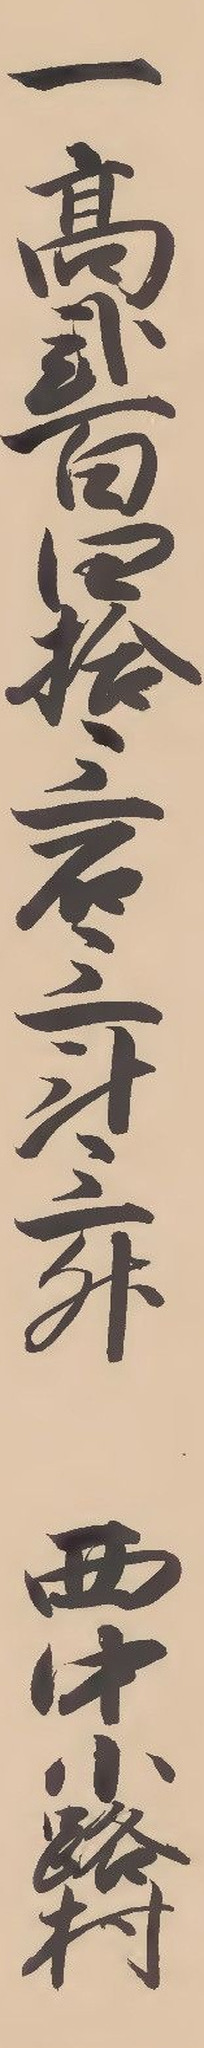一高弐百四拾三石三斗三升西中小路村
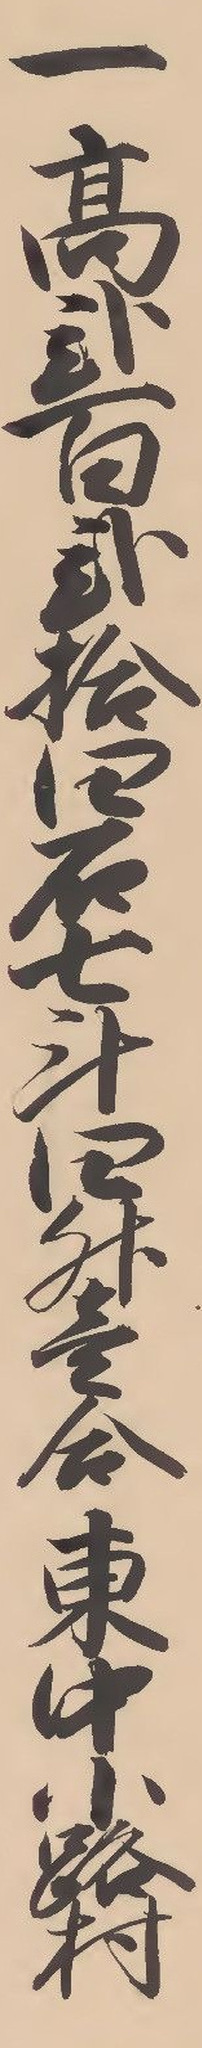一高弐百弐拾四石七斗四升壱合東中小路村
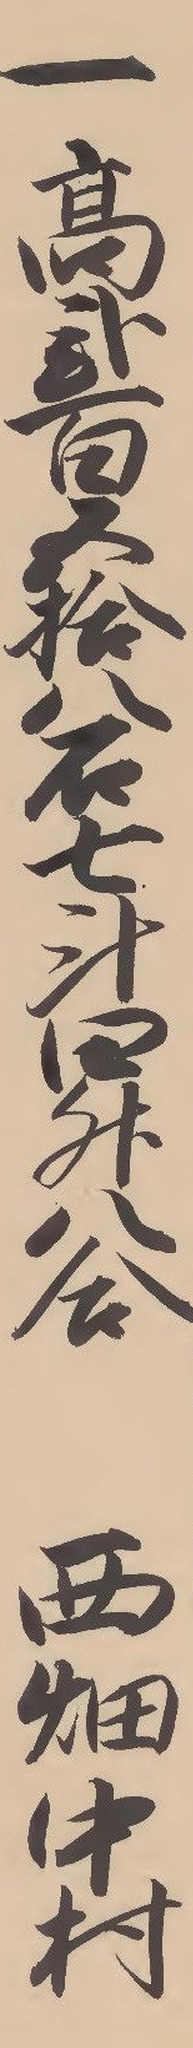一高弐百弐拾四石七斗四升壱合東中小路村
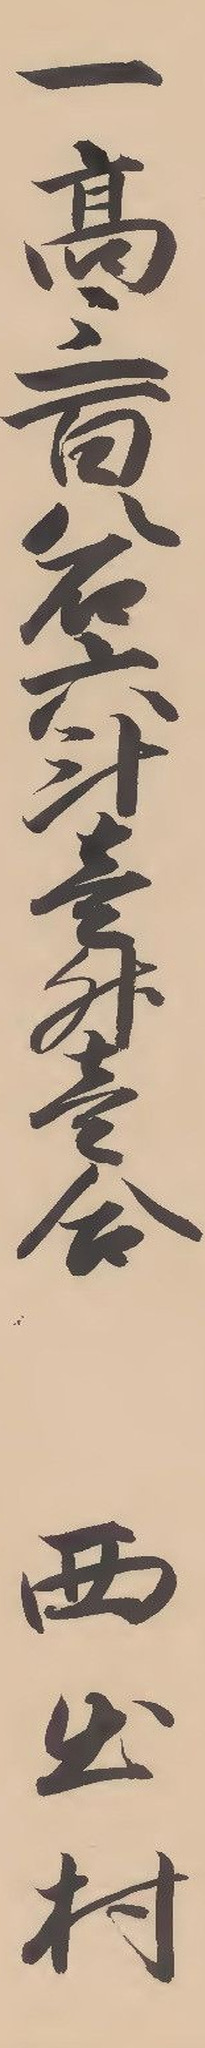一高三百八石六斗壱升壱合西出村
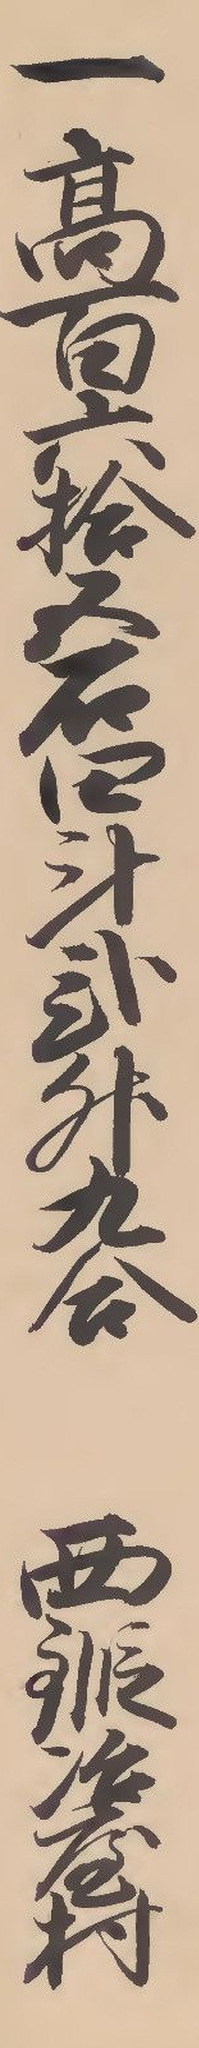一高百六拾五石四斗弐升九合西鍛冶屋村

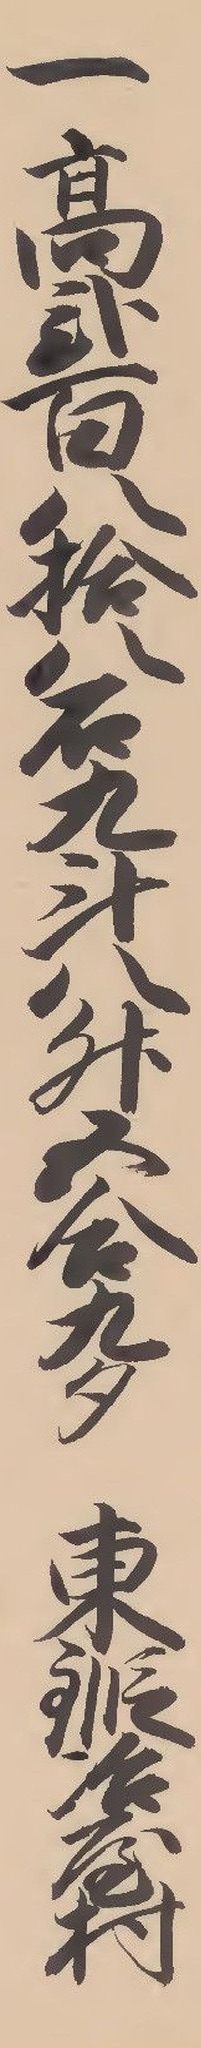一高弐百八拾八石九斗八升五合九勺東鍛冶屋村
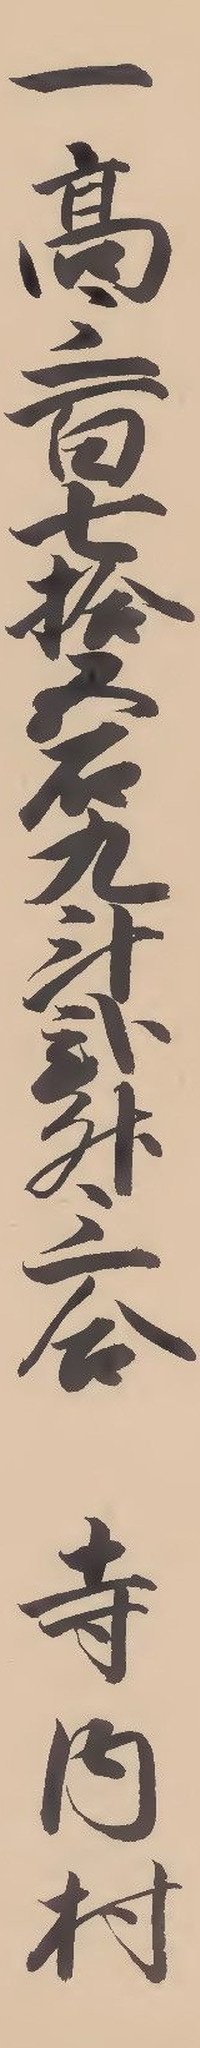一高三百七拾五石九斗弐升三合寺内村
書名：近江国郷帳
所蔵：国立公文書館 National Archives of Japan
